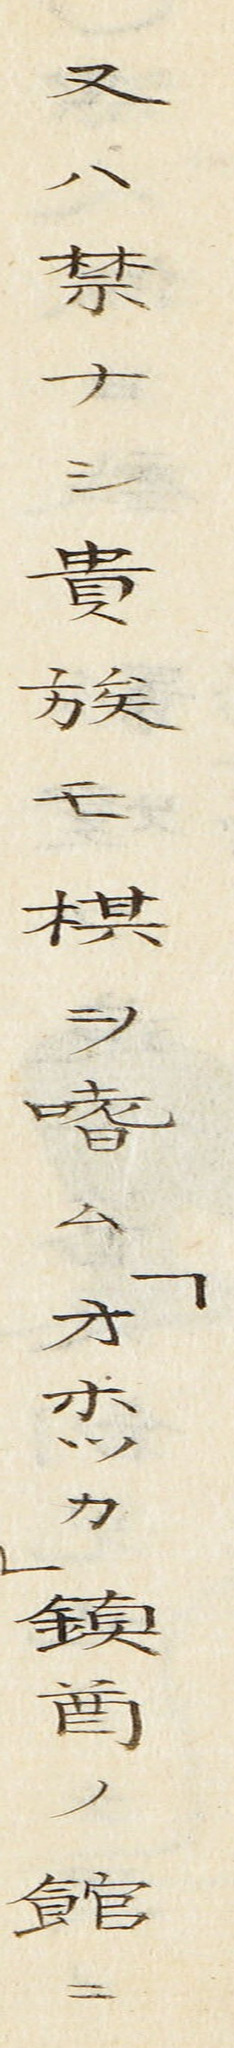又ハ禁ナシ貴族モ棋ヲ嗜ム「オホツカ」鎮酋ノ館ニ
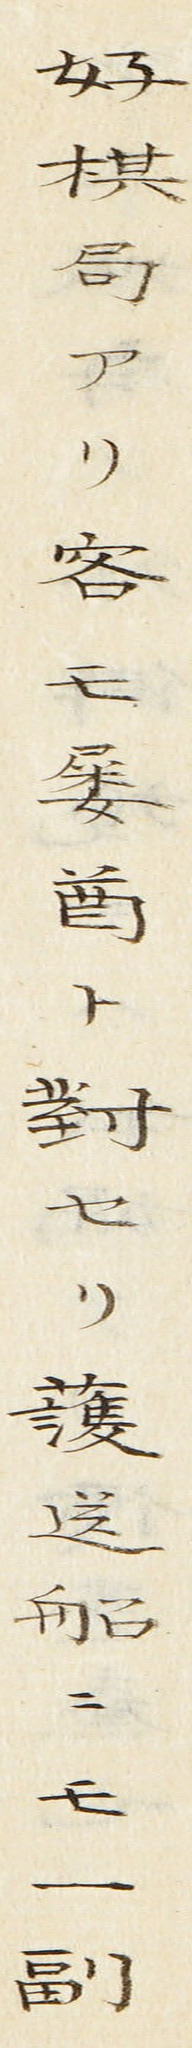好棋局アリ客モ屡酋ト対セリ護送船ニモ一副
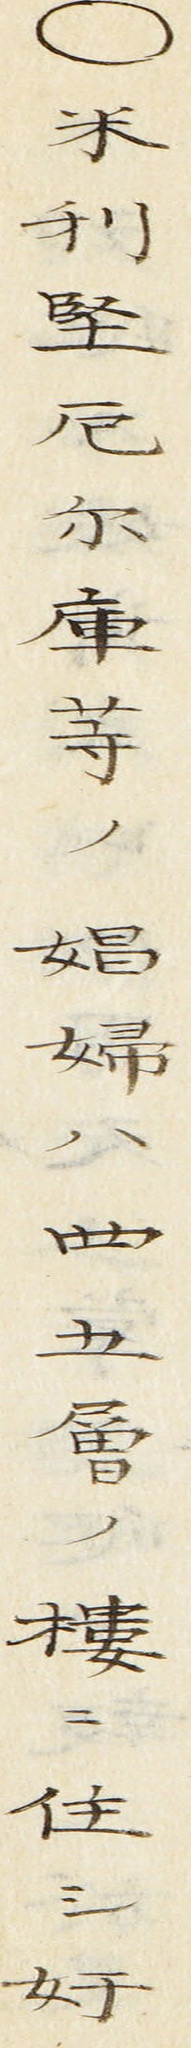〇米利堅厄尓庫等ノ娼婦ハ四五層ノ楼ニ住シ奸
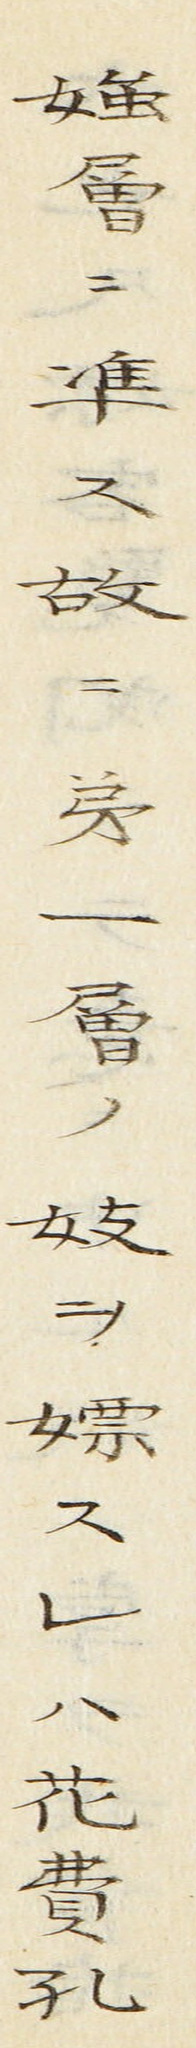層ニ準ス故ニ第一層ノ妓ヲ嫖スレハ花費孔

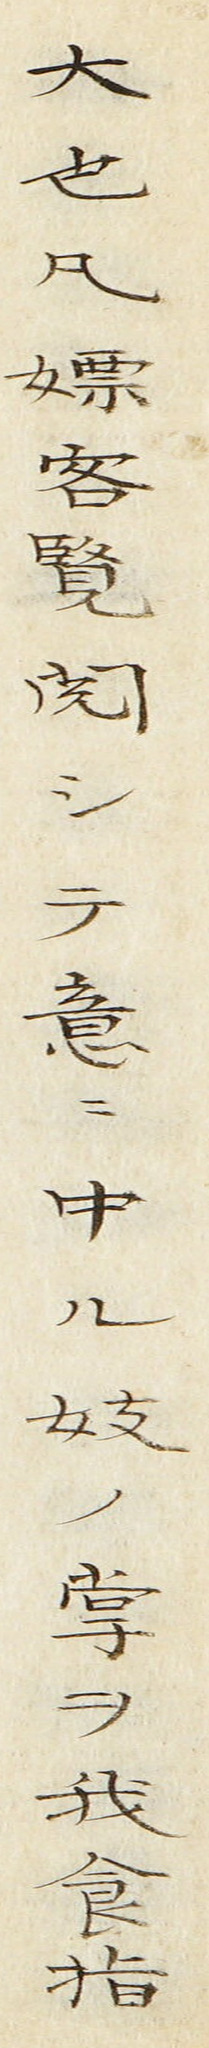大也凡嫖客覧閲シテ意ニ中ル妓ノ掌ヲ我食指
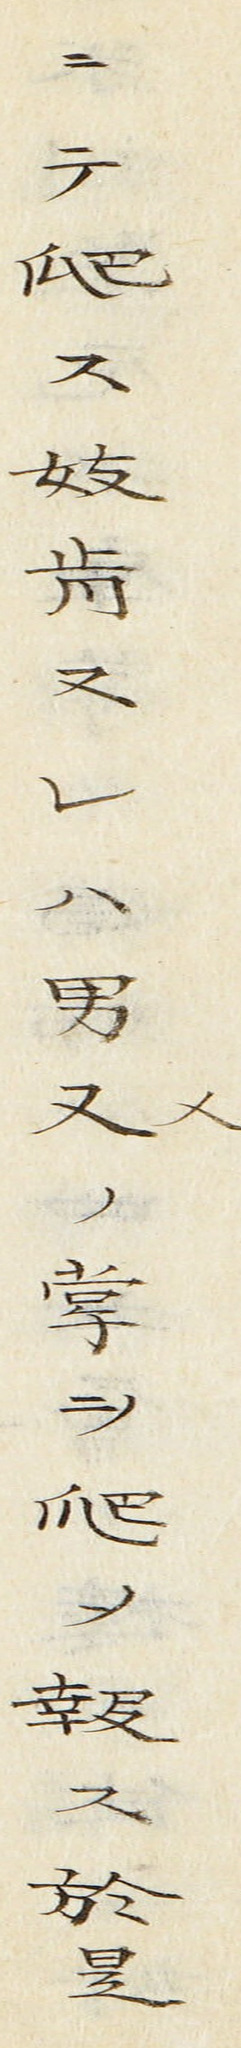ニテ爬ス妓肯ヌレハ男又ノ掌ヲ爬メ報ス於是
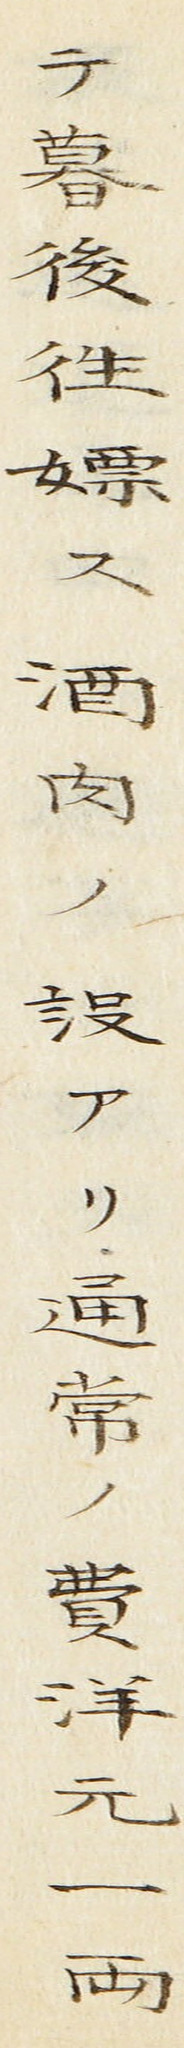テ暮後往嫖ス酒肉ノ設アリ通常ノ費洋元一両
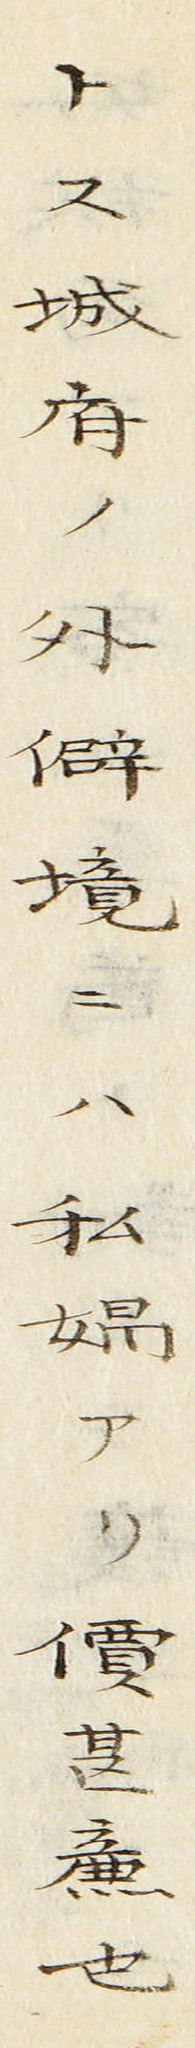トス城府ノ外僻境ニハ私娼アリ価甚廉也
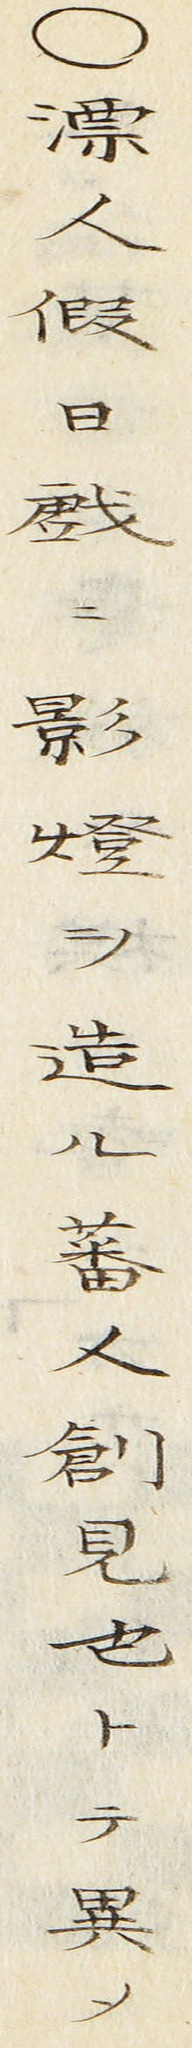〇漂人仮日戯ニ影灯ヲ造ル蕃人創見也トテ異シテ
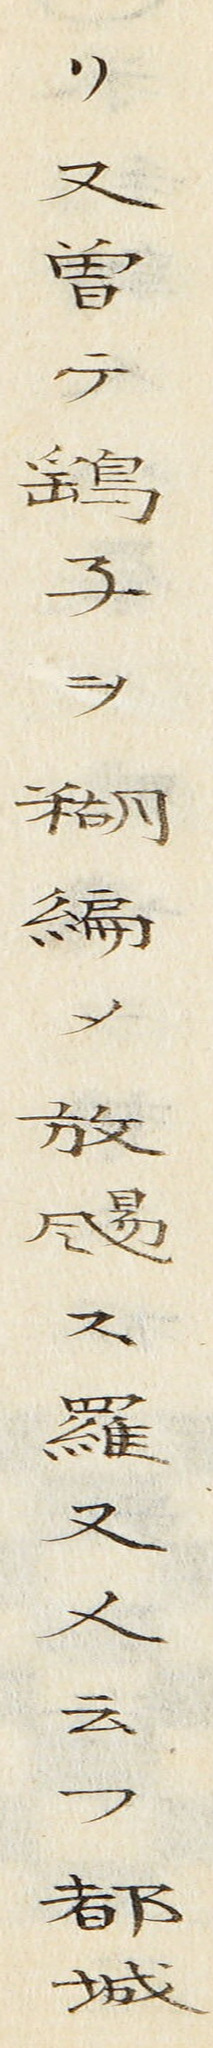リ又曽テ鷂子ヲ糊編シテ放颺ス羅又人云フ都城
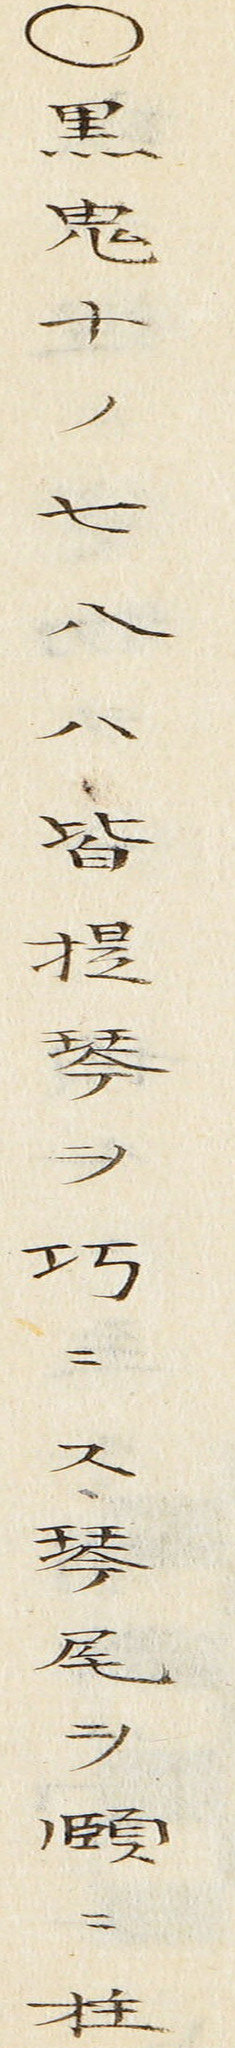〇黒鬼十ノ七八ハ皆提琴ヲ巧ニス琴尾ヲ頤ニ拄
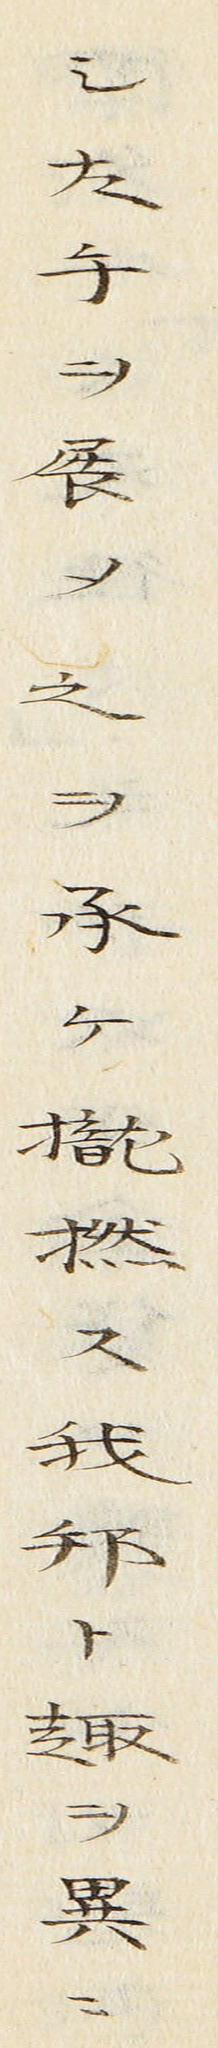シ左手ヲ展シテ之ヲ承ケ撚ス我邦ト趣ヲ異ニ
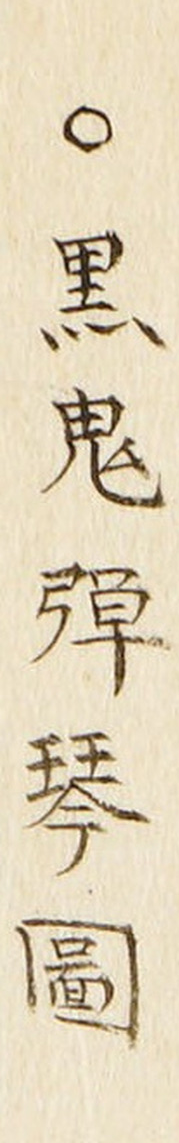〇黒鬼弾琴図
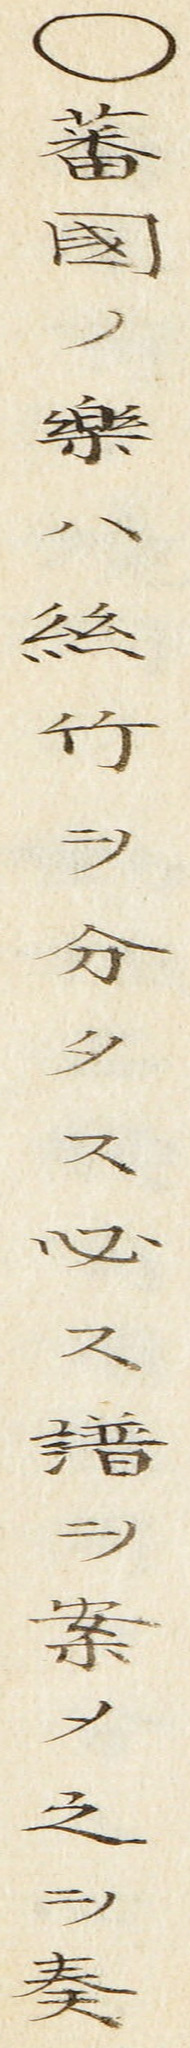〇蕃国ノ楽ハ絲竹ヲ分タス必ス譜ヲ案シテ之ヲ奏
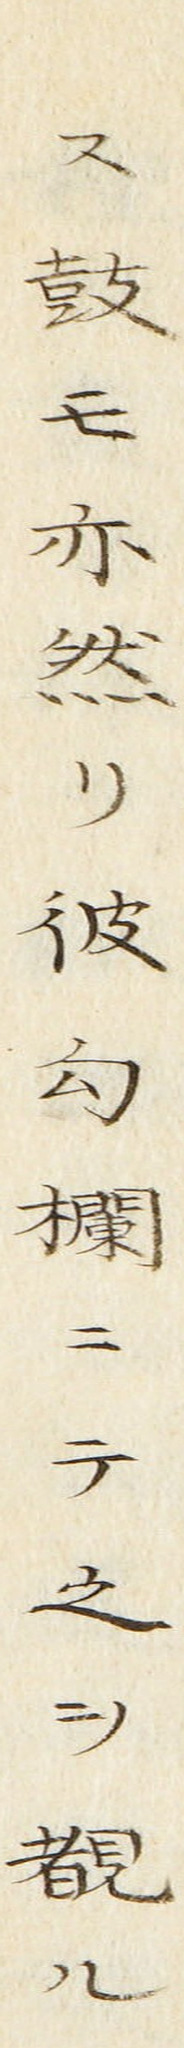ス鼓モ亦然リ彼勾欄ニテ之ヲ覩ル

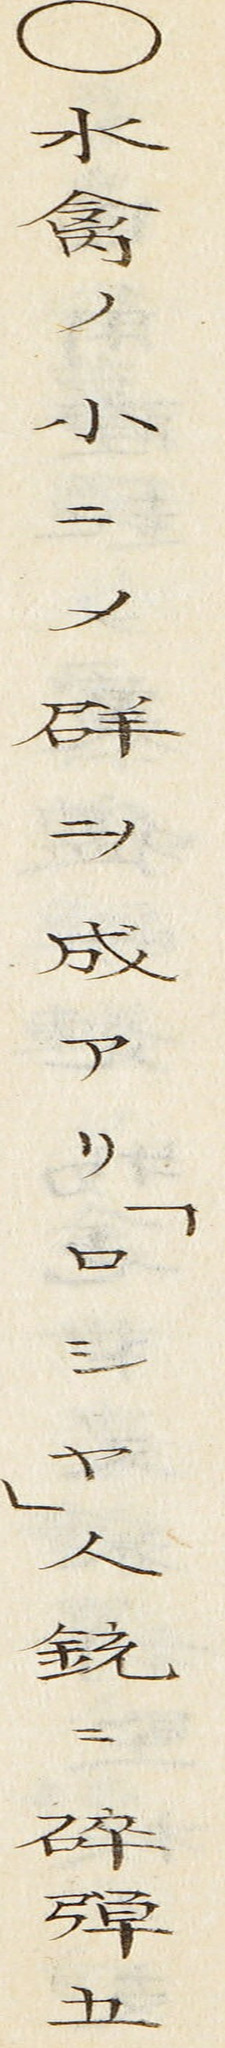〇水禽ノ小ニシテ群ヲ成アリ「ロシヤ」人銃ニ碎弾五
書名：蕃談
